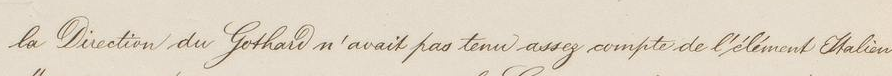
la Direction du Gothard n'avait pas tenu assez compte de l'élément Italien.
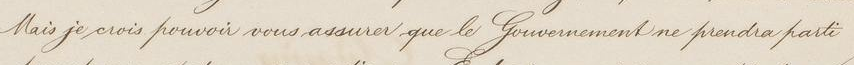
Mais je crois pouvoir vous assurer que le Gouvernement ne prendra parti
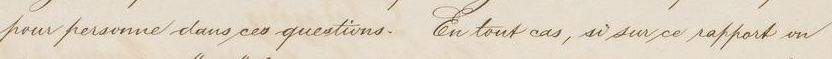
pour personne dans ces questions. En tout cas, si sur ce rapport on
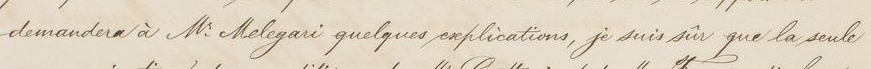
demandera à MrMelegari quelques explications, je suis sûr que la seule
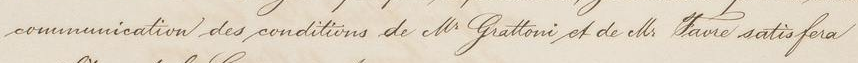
communication des conditions de MrGrattoni et de MrFavre satisfera
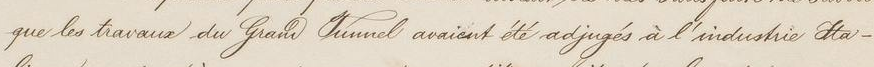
que les travaux du Grand Tunnel avaient été adjugés à l'industrie Ita-
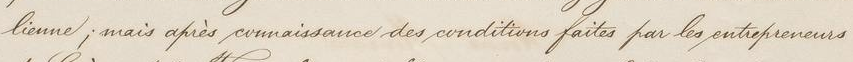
lienne; mais après connaissance des conditions faites par les entrepreneurs
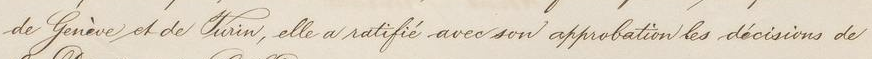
de Genève et de Turin, elle a ratifié avec son approbation les décisions de
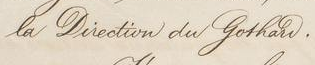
la Direction du Gothard.
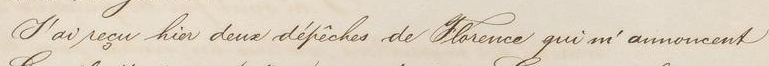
J'ai reçu hier deux dépêches de Florence qui m'annoncent
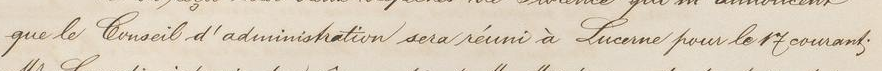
que le Conseil d'administration sera réuni à Lucerne pour le 17 courant.
